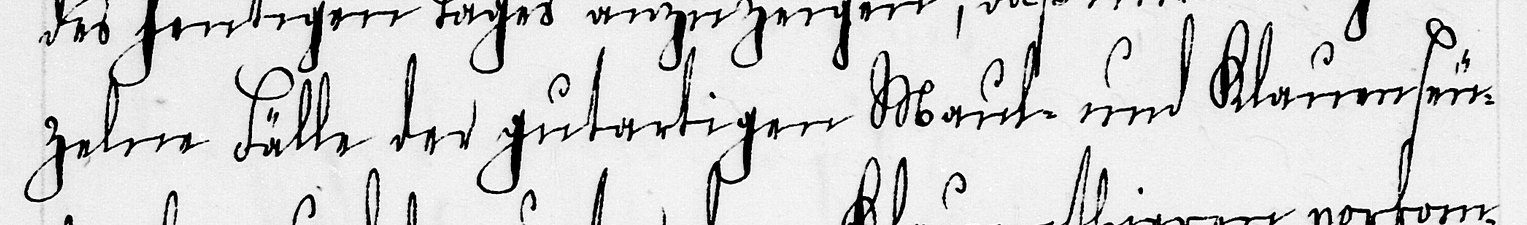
zelne Fälle der gutartigen Maul- und Klauenseu¬
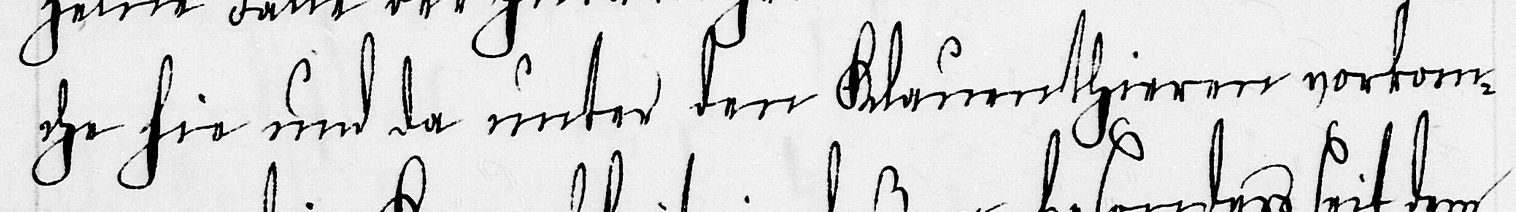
che hie und da unter den Klauenthieren vorkom¬
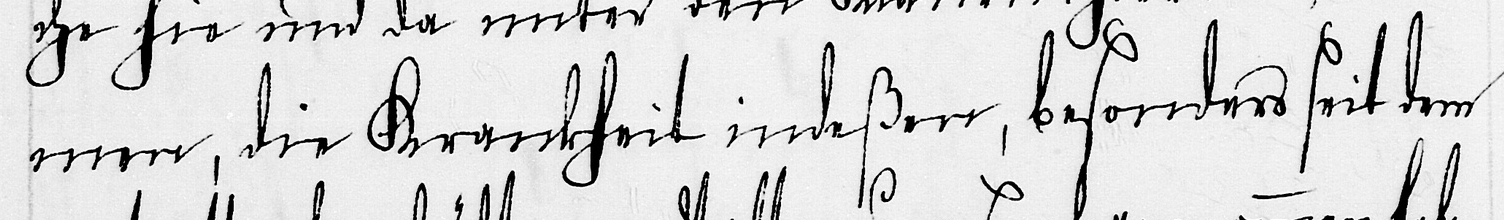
men, die Krankheit indeßen, besonders seit dem
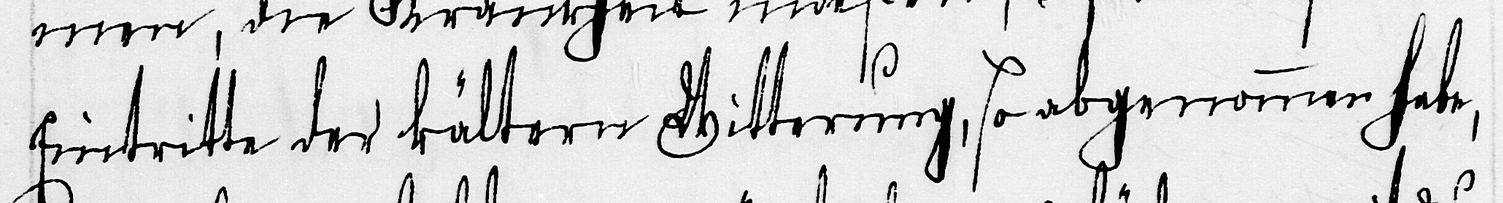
Eintritte der kältern Witterung, so abgenommen hab¬
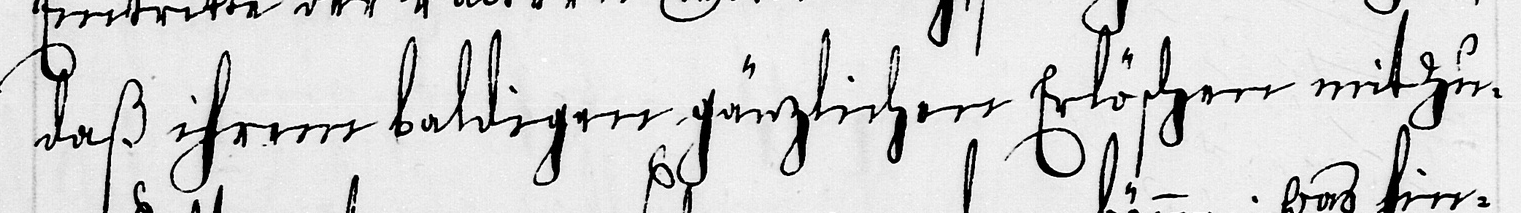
daß ihrem baldigen gänzlichen Erlöschen mit Zu¬
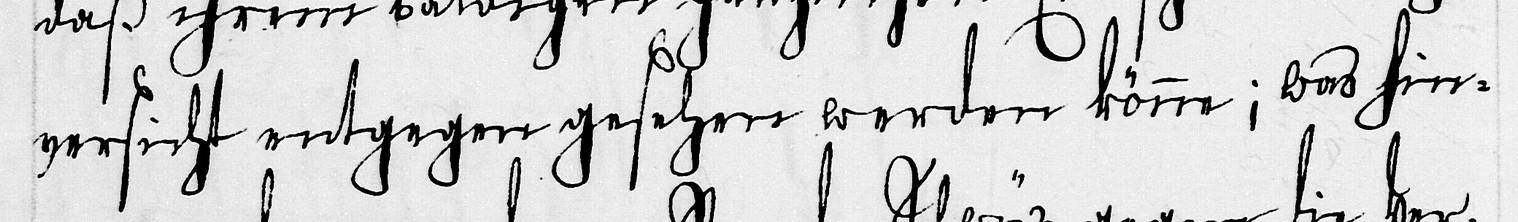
versicht entgegen gesehen werden könne; was hin¬
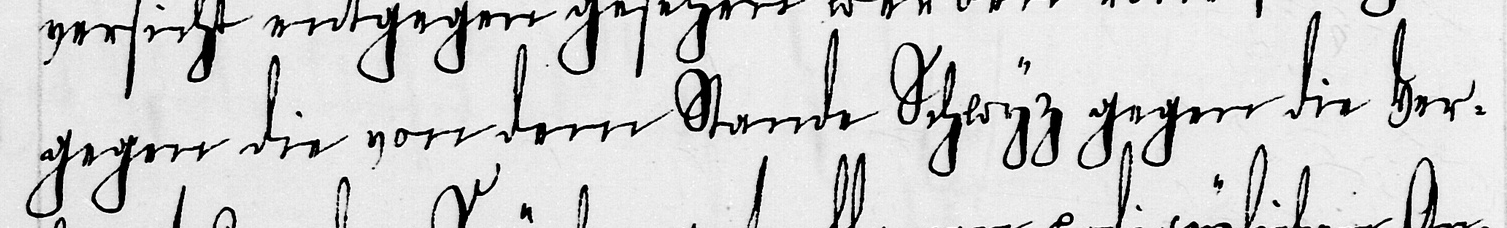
gegen die von dem Stande Schwyz gegen die Ver¬
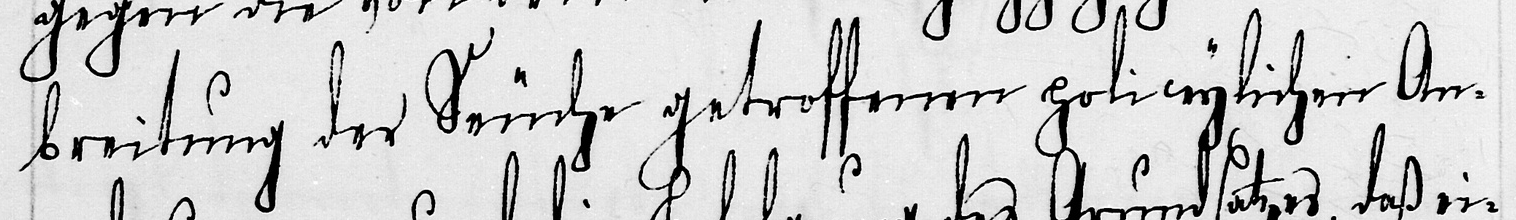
breitung der Seuche getroffenen policeylichen An¬
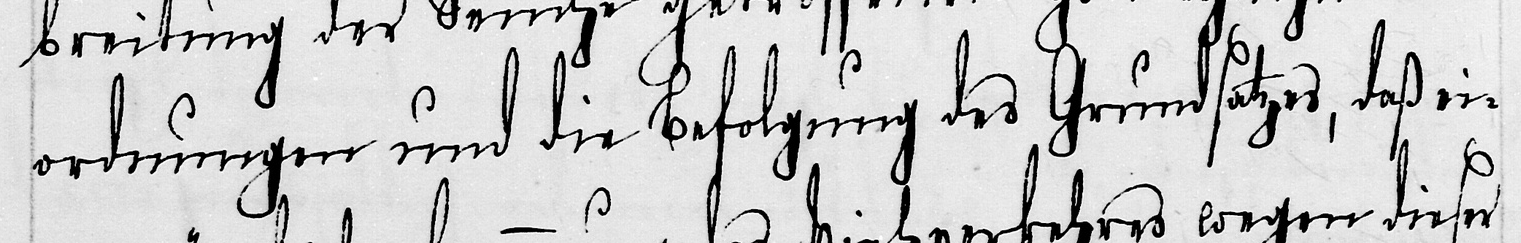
ordnungen und die Befolgung des Grundsatzes, daß e¬
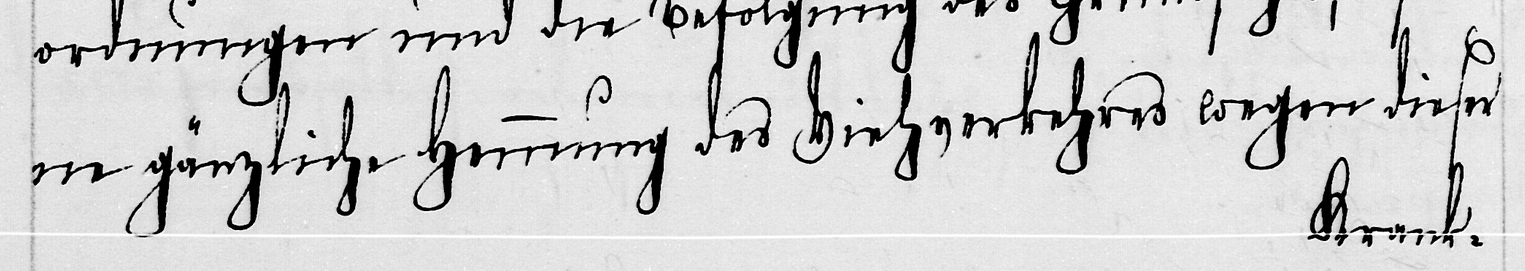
ine gänzliche Hemmung des Viehverkehres wegen dieser
